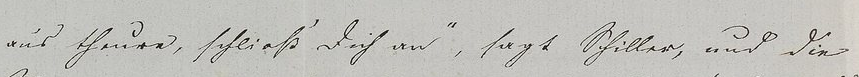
an's theure, schließ' Dich an», sagt Schiller, und die
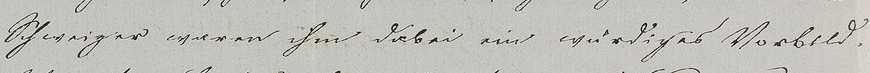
Schweizer waren ihm dabei ein würdiges Vorbild.
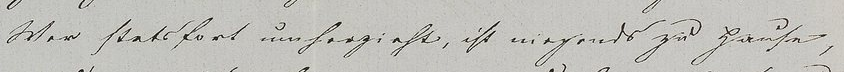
Wer stetsfort umherzieht, ist nirgends zu Hause,
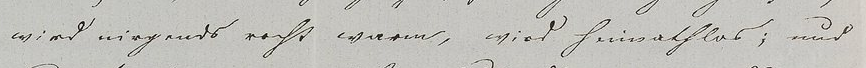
wird nirgends recht warm, wird heimathlos; und
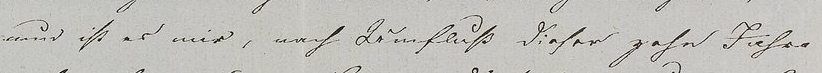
nun ist es mir, nach Umfluß dieser zehn Jahre
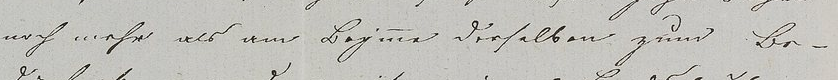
noch mehr als am Beginn derselben zum Be-
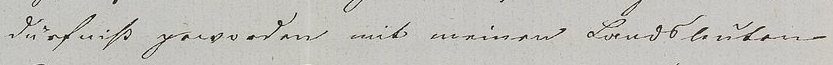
dürfniß geworden mit meinen Landsleuten
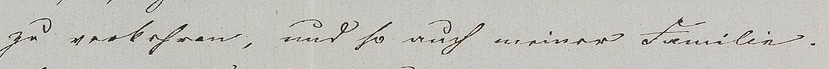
zu verkehren, und so auch meiner Familie.
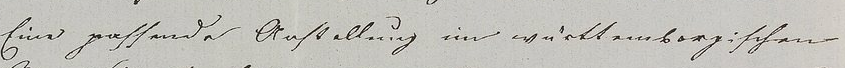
Eine passende Anstellung im württembergischen
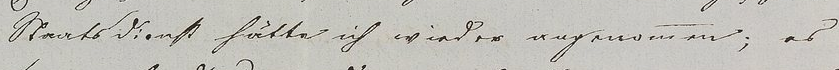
Staatsdienst hätte ich wieder angenommen; es
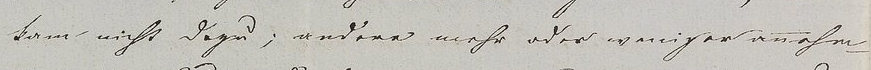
kam nicht dazu; andere mehr oder weniger annehm-
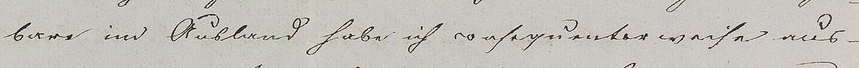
bare im Ausland habe ich consequenterweise aus-
